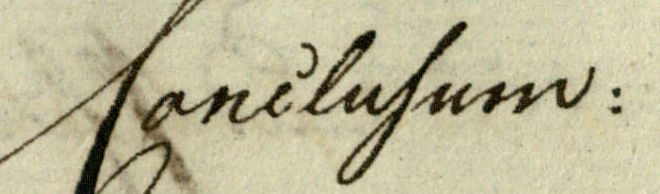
Conclusum:
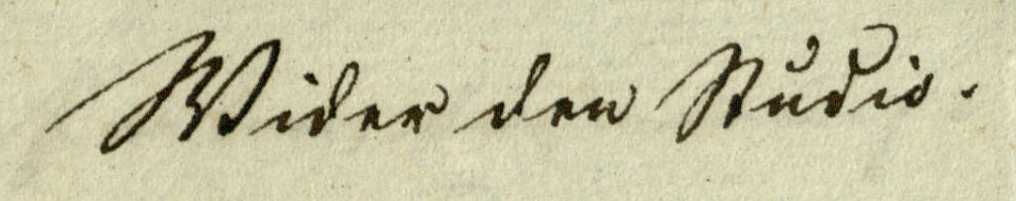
Wider den Studio¬
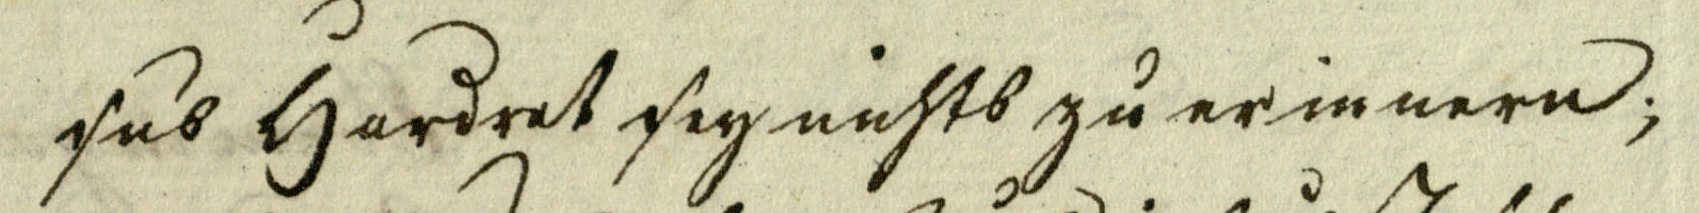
sus Hardrat sey nichts zu erinnern;
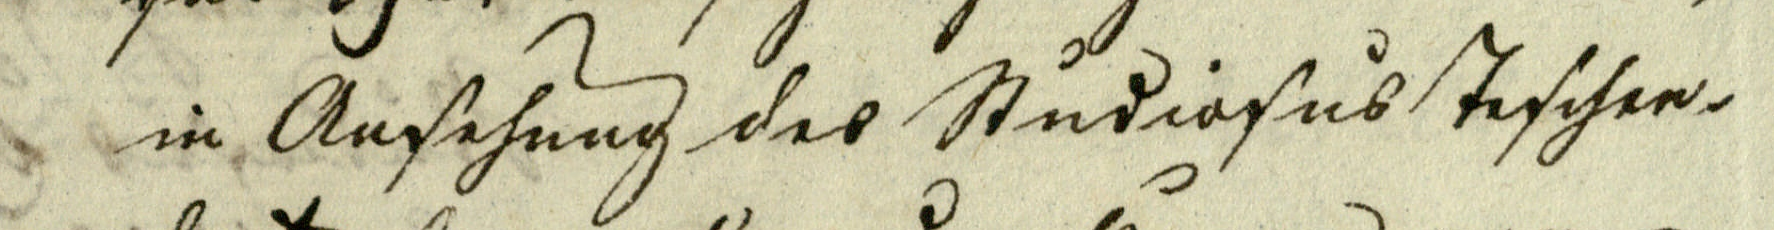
in Ansehung des Studiosus Teschen¬
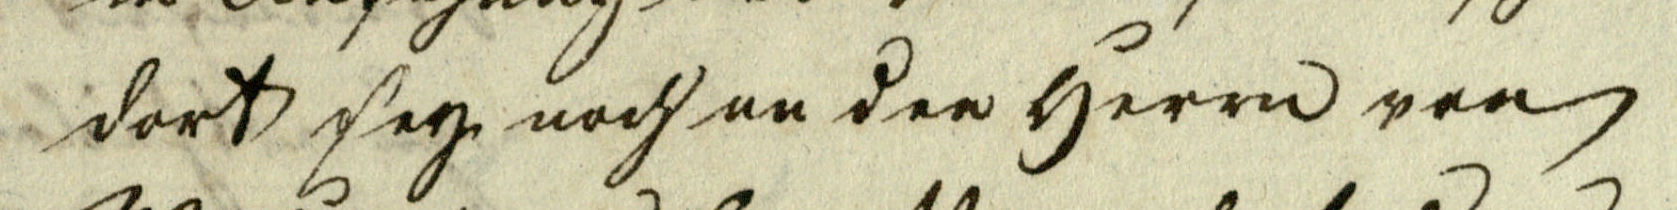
dorf sey noch an den Herrn von
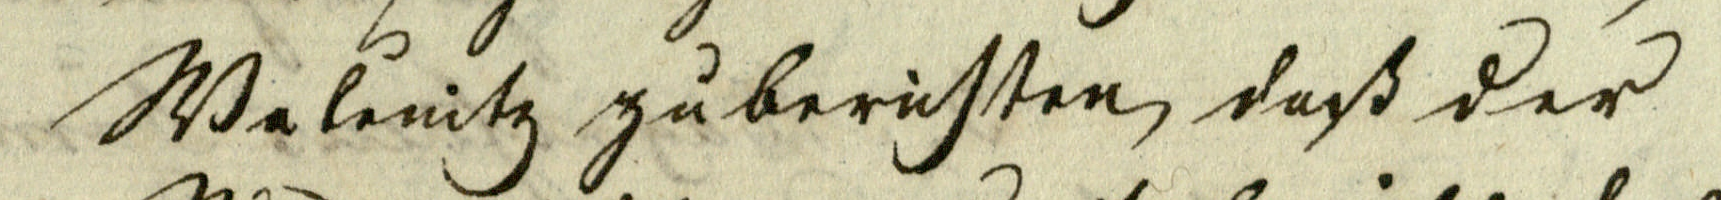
Wakenitz zu berichten, daß der
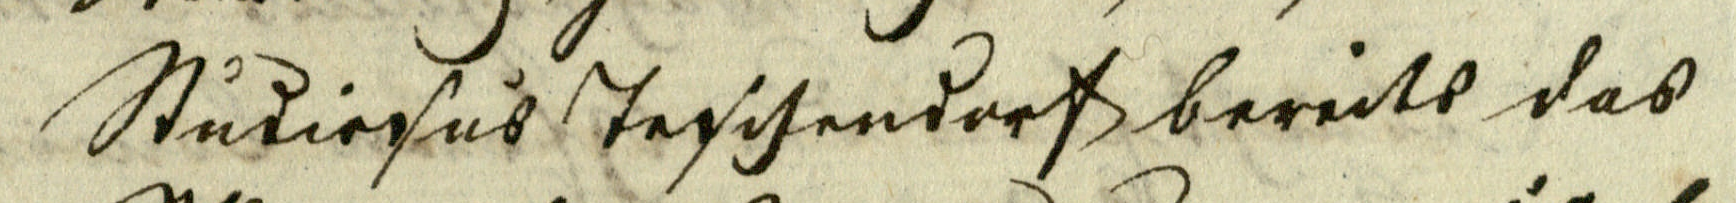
Studiosus Teschendorf bereits das
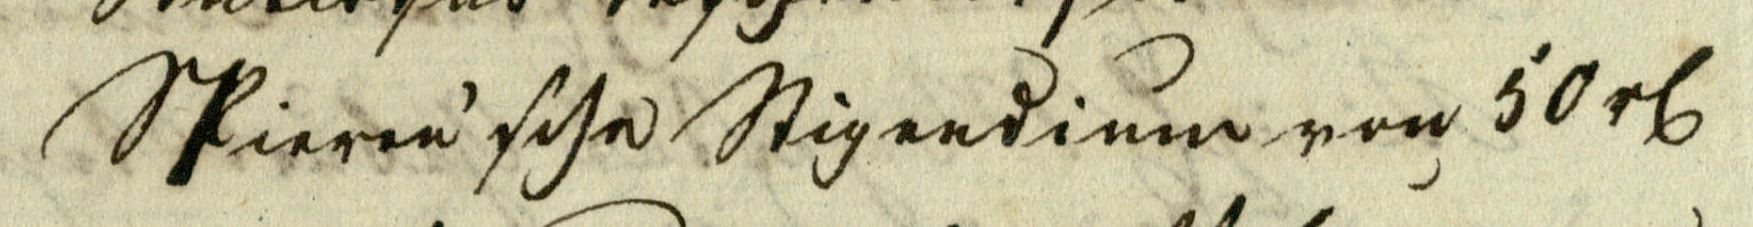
Spieren'sche Stipendium von 50 r.
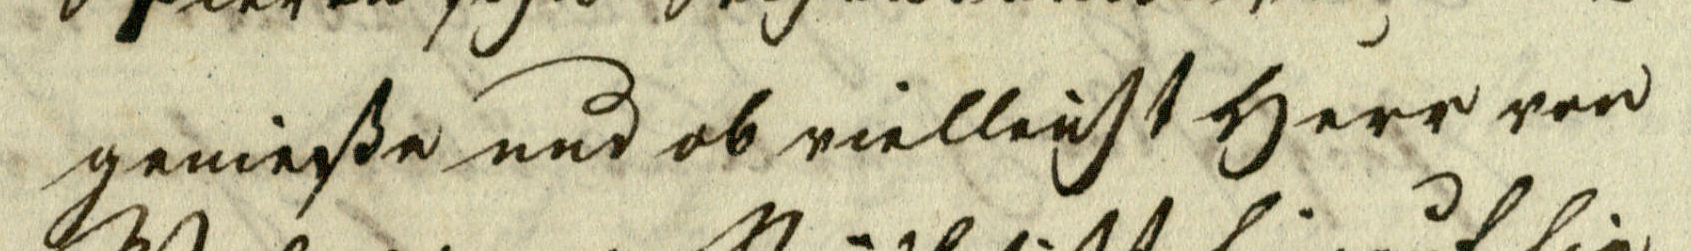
genieße und ob vielleicht Herr von
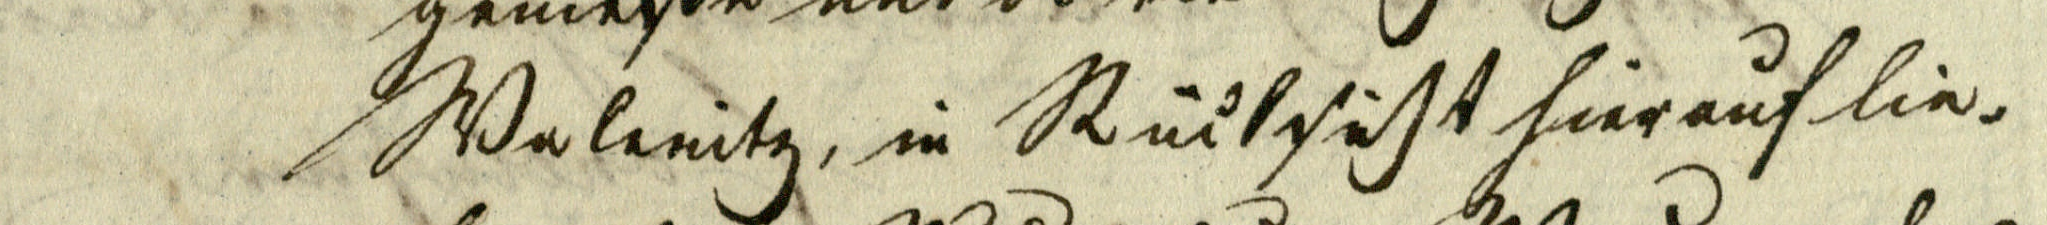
Wakenitz, in Rücksicht hierauf lie¬
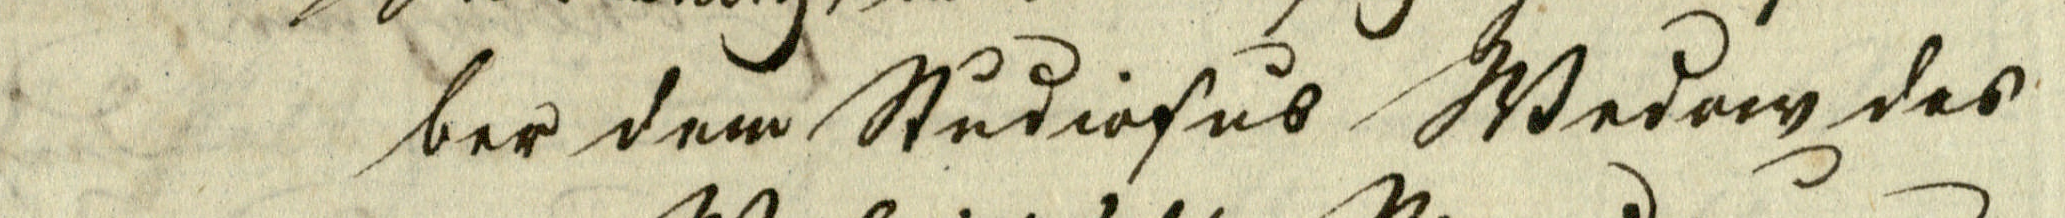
ber dem Studiosus Wedow das
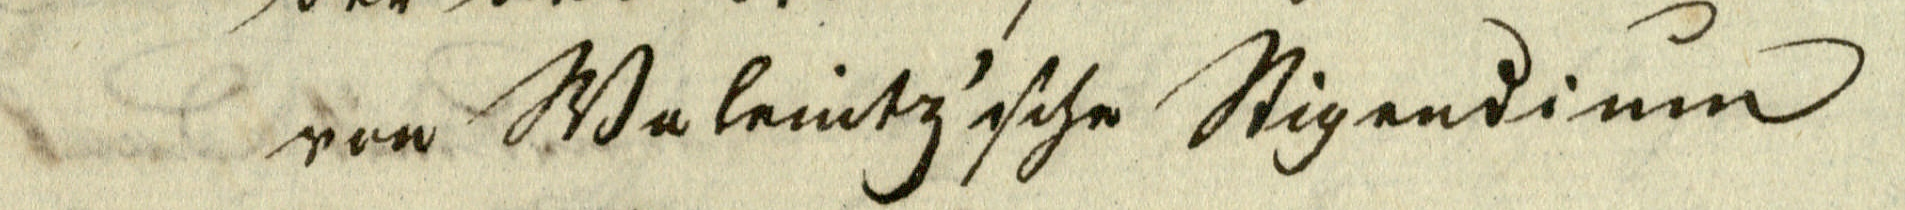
von Wakenitz'sche Stipendium
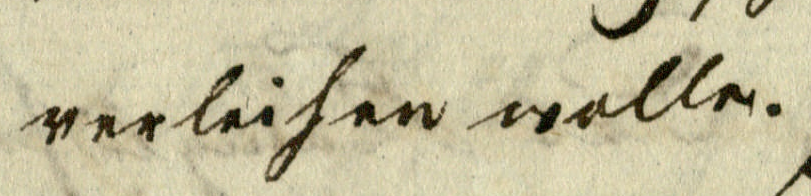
verleihen wolle.
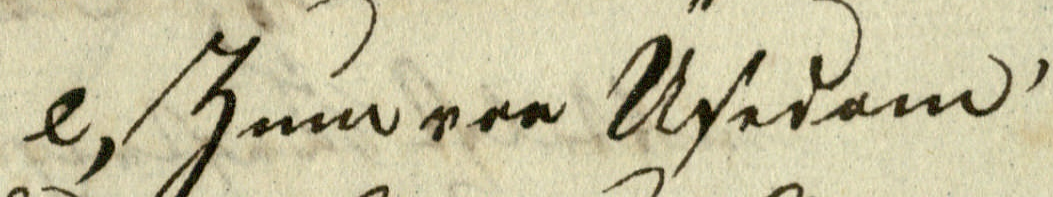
e, Zum von Usedom'
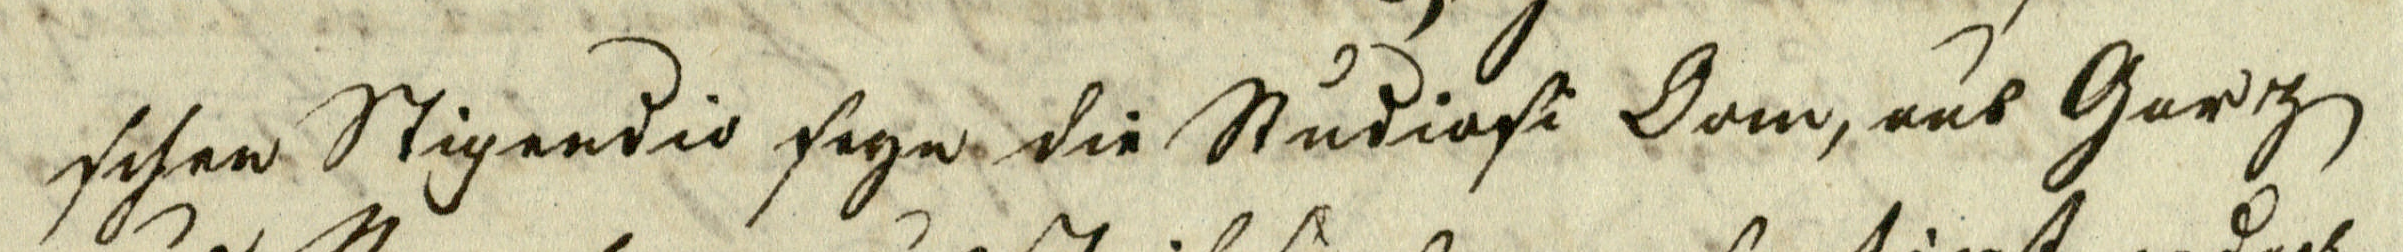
schen Stipendio seyn die Studiosi Oom, aus Garz
